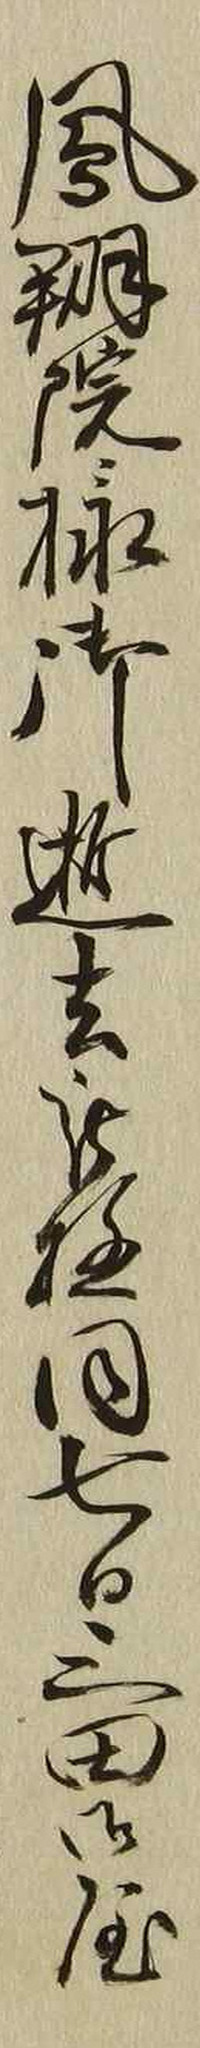鳳翔院様御逝去被遊同七日三田御屋
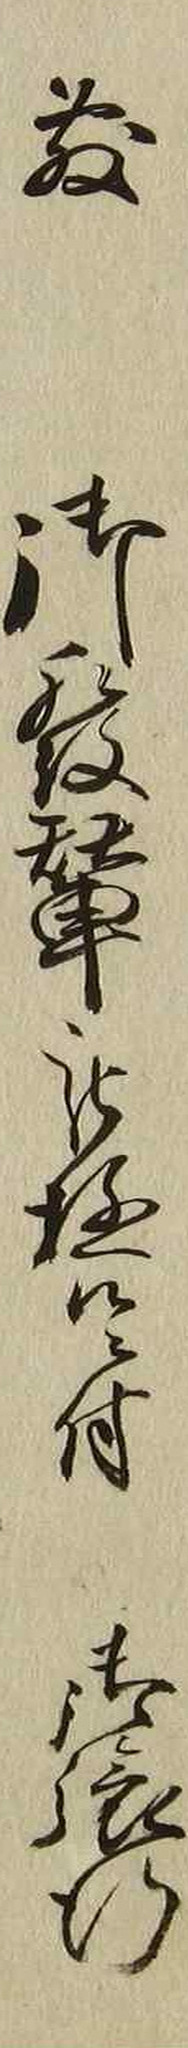敷御発輦被遊候ニ付御旅行
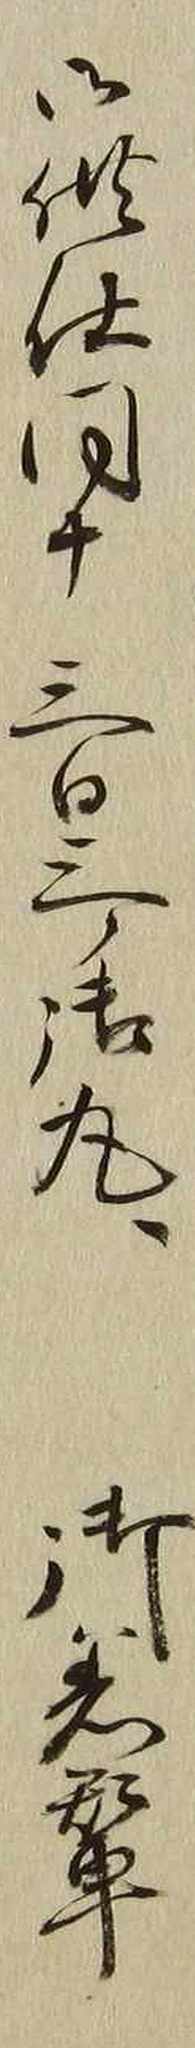御供仕同十三日三ノ御丸へ御着輦
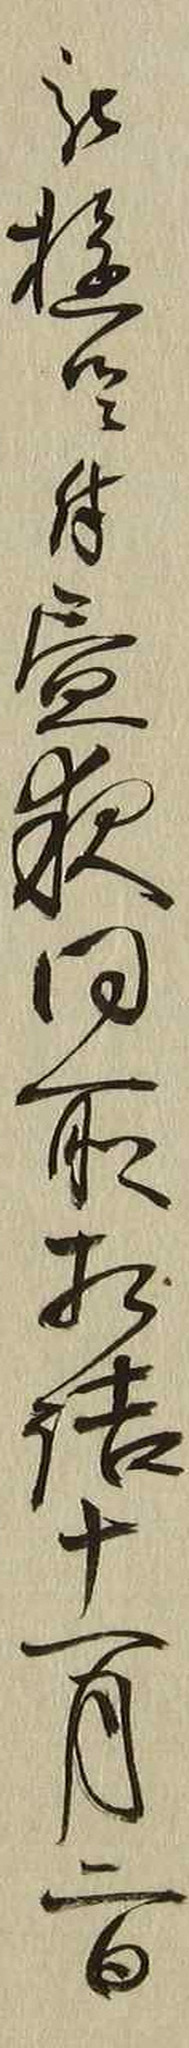被遊候ニ付昼夜同所へ相詰十一月二日
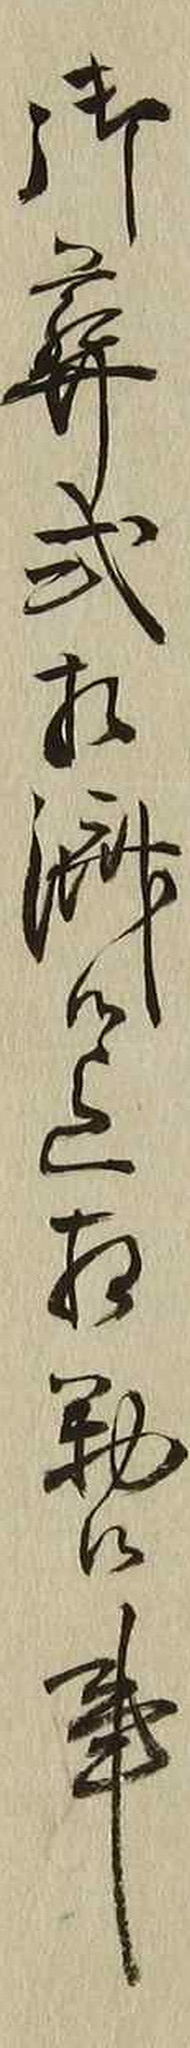御葬式相済候迄相勤候事
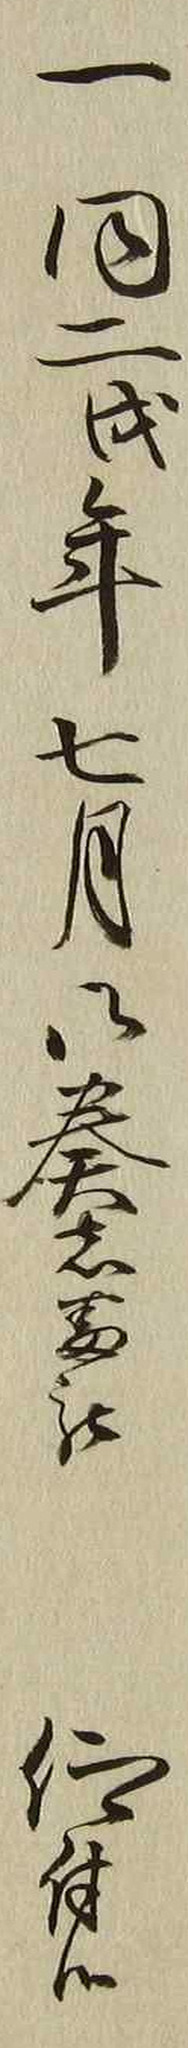一同二戌年七月御奏者番被仰付候
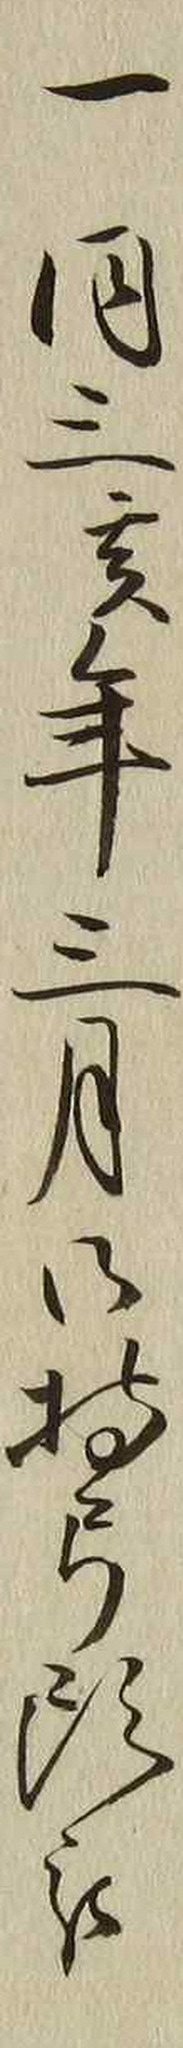一同三亥年三月御持弓頭被
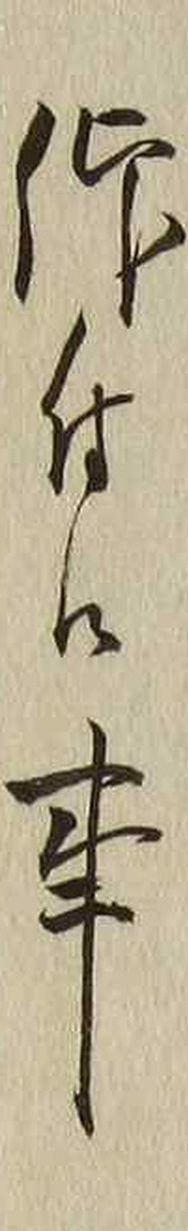仰付候事
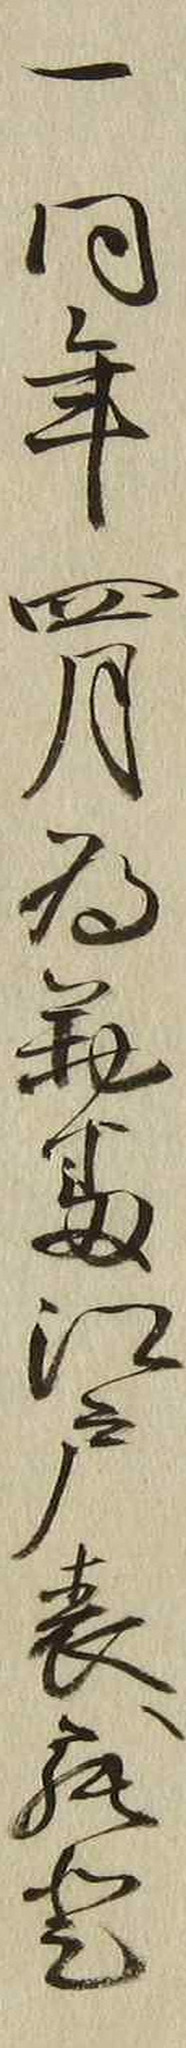一同年四月為勤番江戸表へ罷登
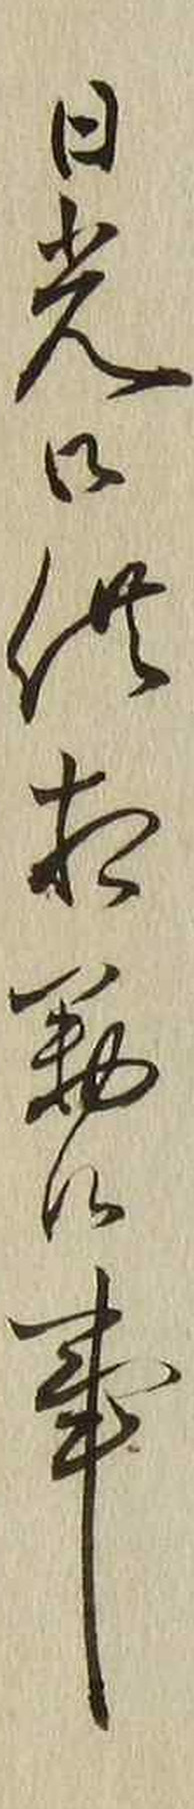日光御供相勤候事
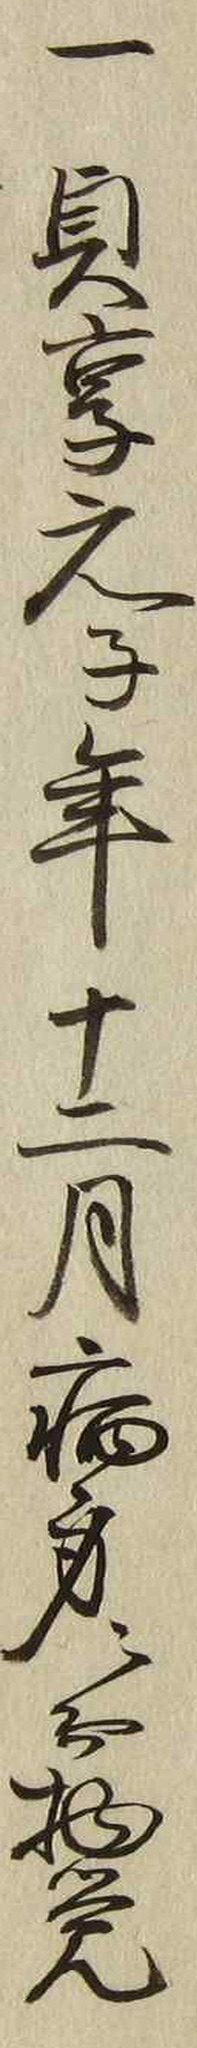一貞享元子年十二月病身ニ而物覚
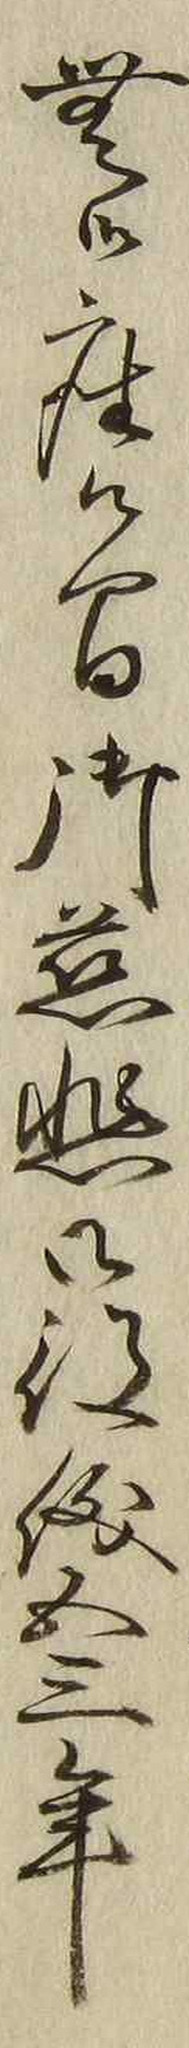無御座候間御慈悲御役儀五三年
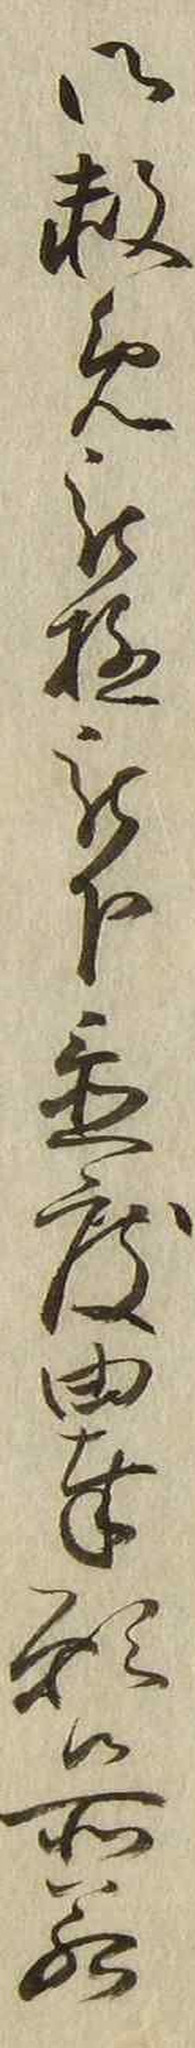御赦免被遊被下置度由奉願候所若
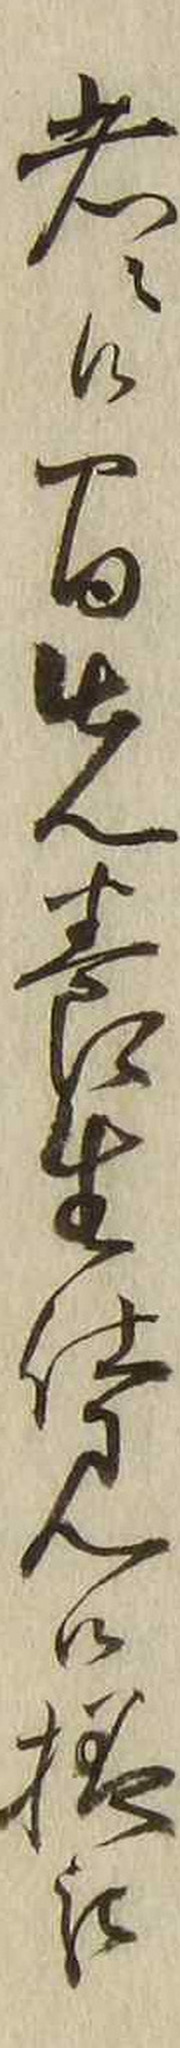者ニ候間先養生仕見候様被

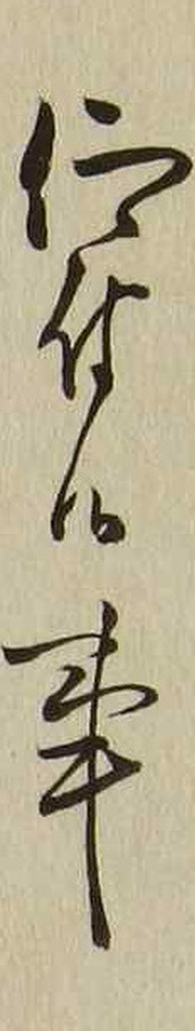仰付候事
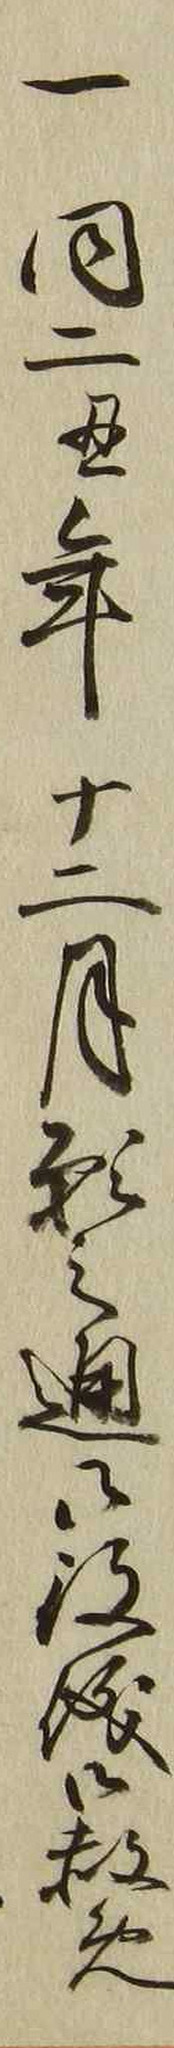一同二丑年十二月願之通御役儀御赦免
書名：諸士系譜　巻之60　と之部3
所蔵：会津若松市立会津図書館
